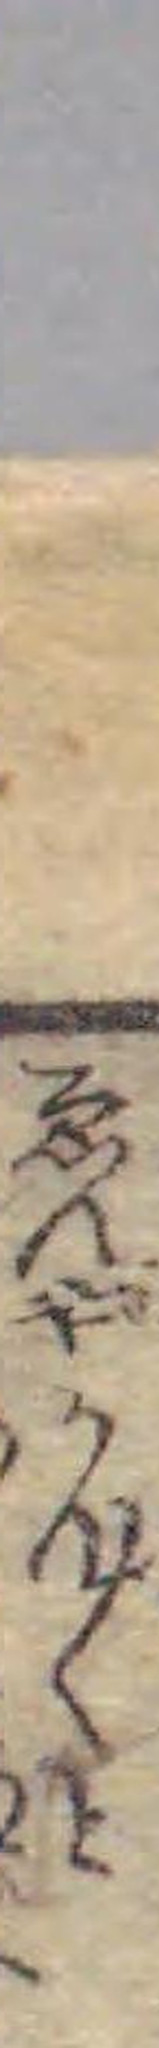ゑんやかん〳〵と
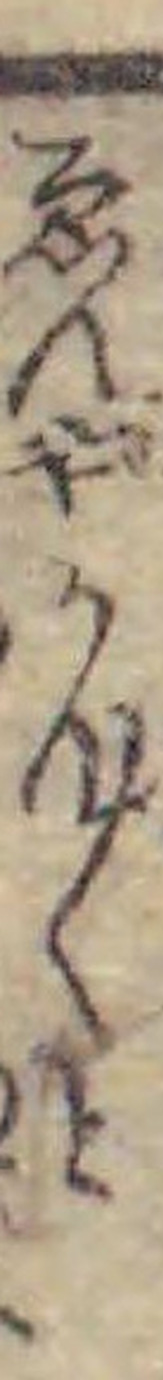ゑんやかん〳〵と
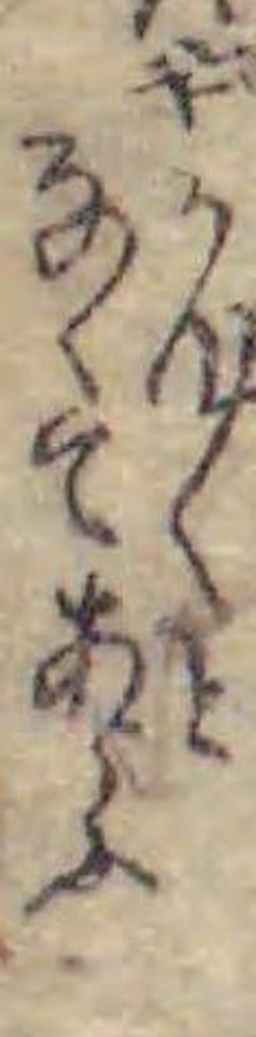なくてあらふ

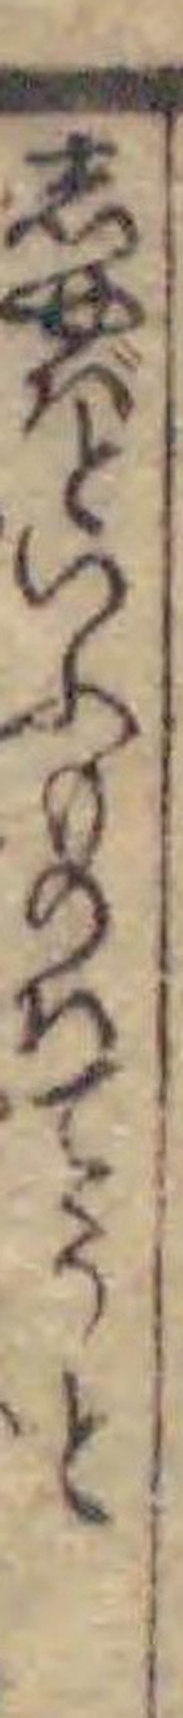しやばといふものはてうと
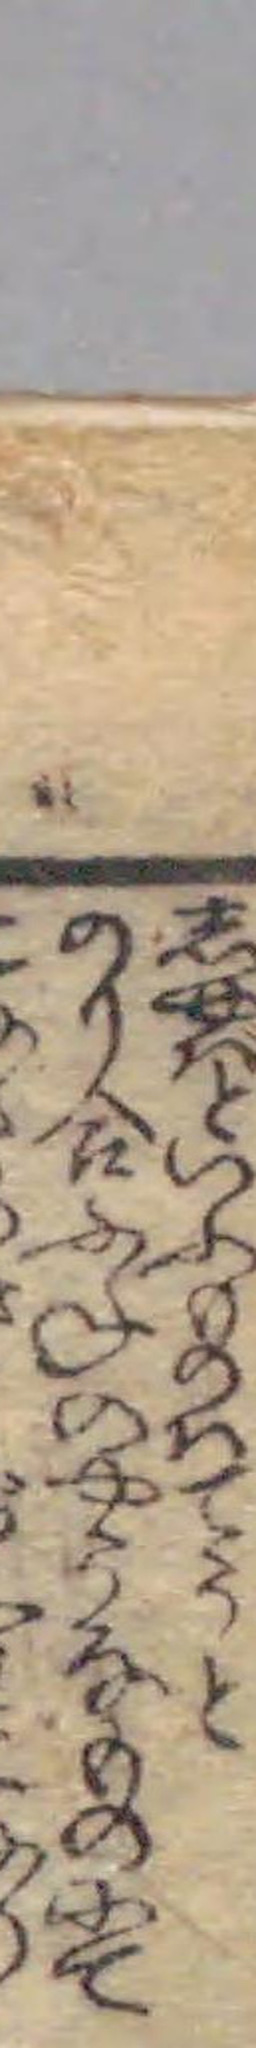のり合ふねのやうなものにて
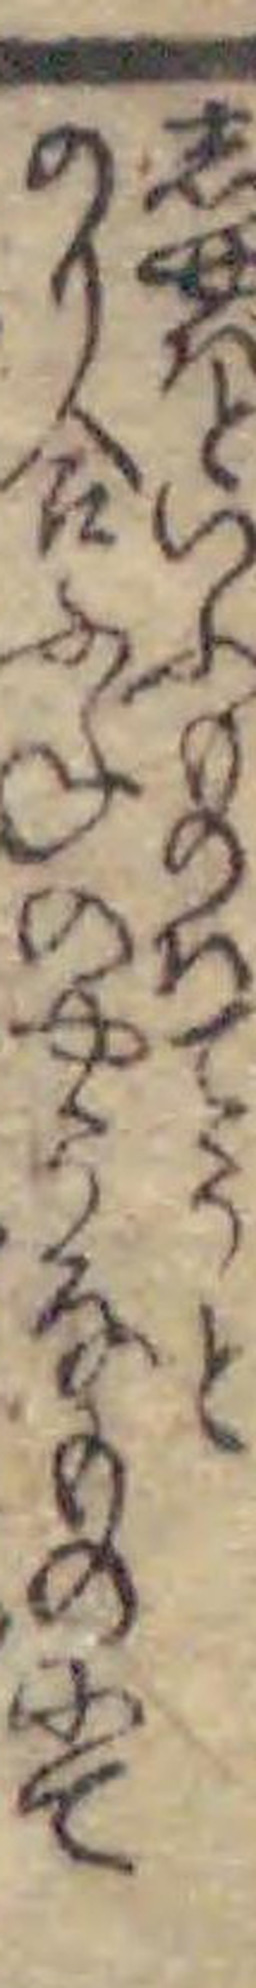のり合ふねのやうなものにて
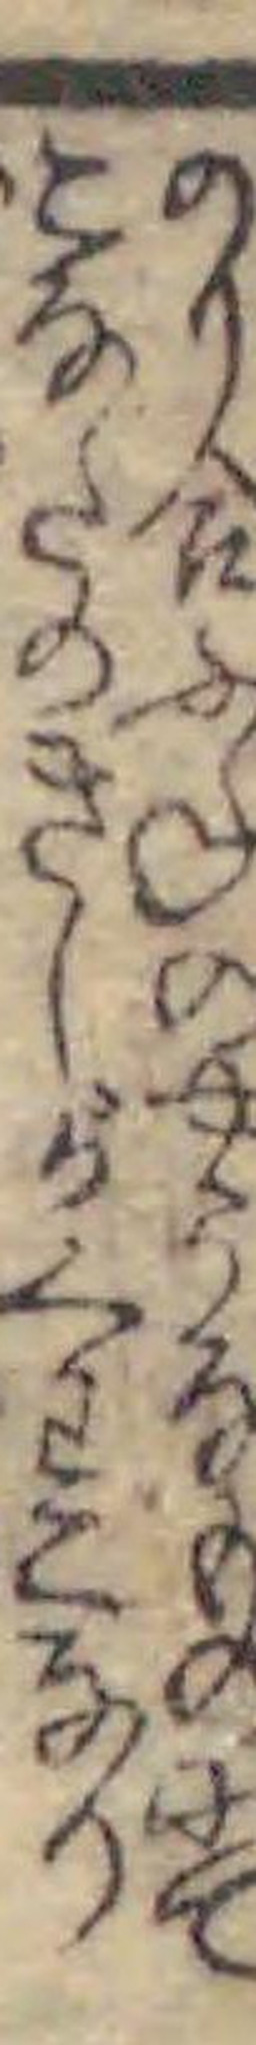こなたのきしがくわこなり
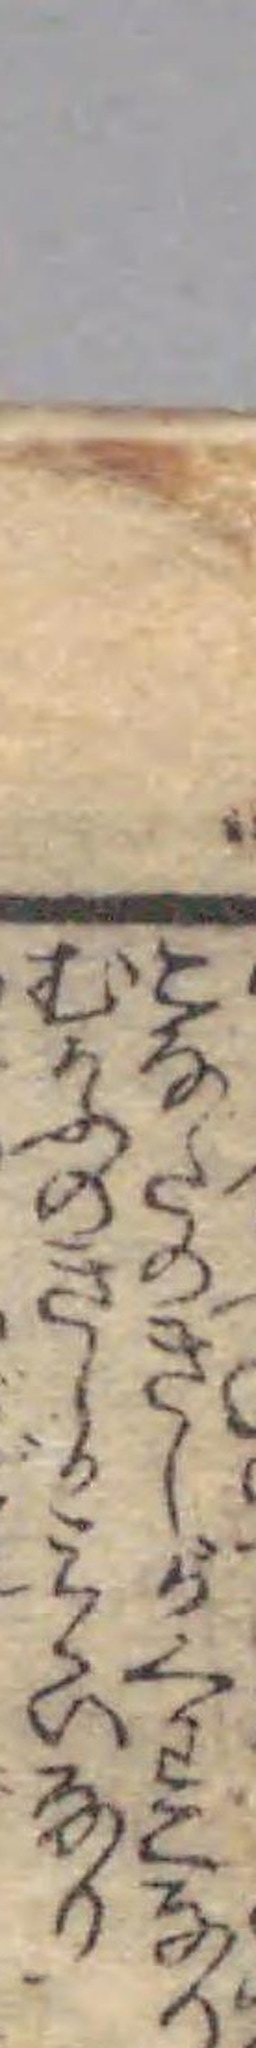むかふのきしかみらいなり
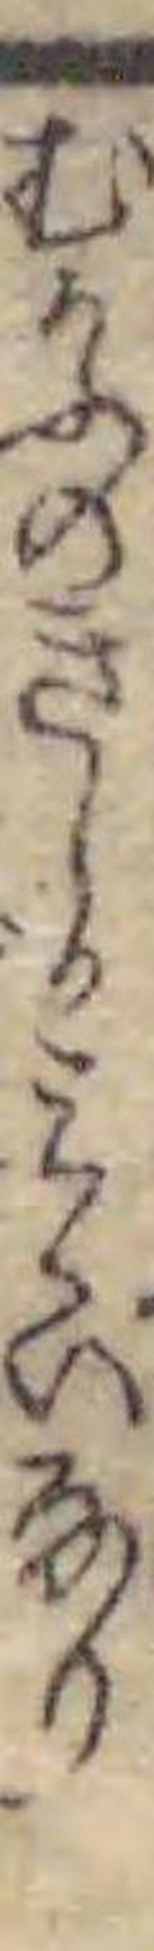むかふのきしかみらいなり
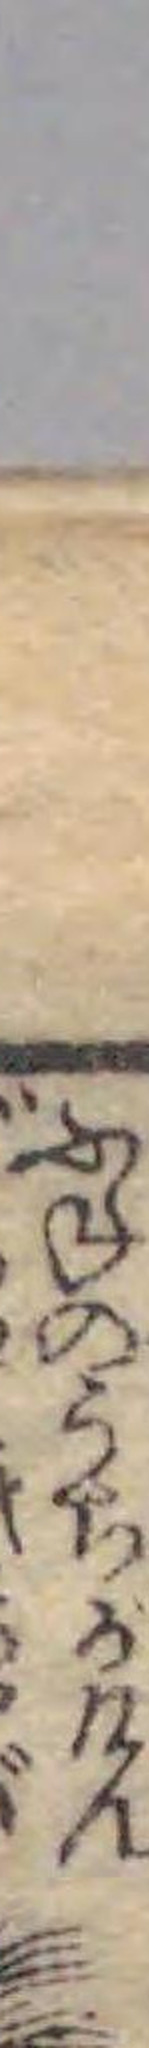ふねのうちがげん
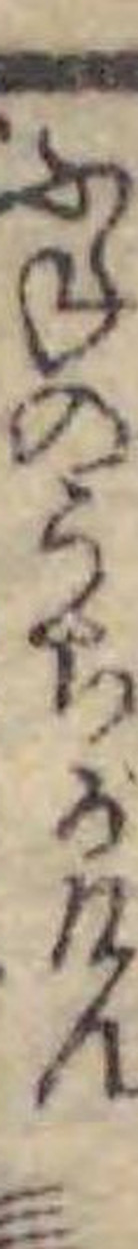ふねのうちがげん
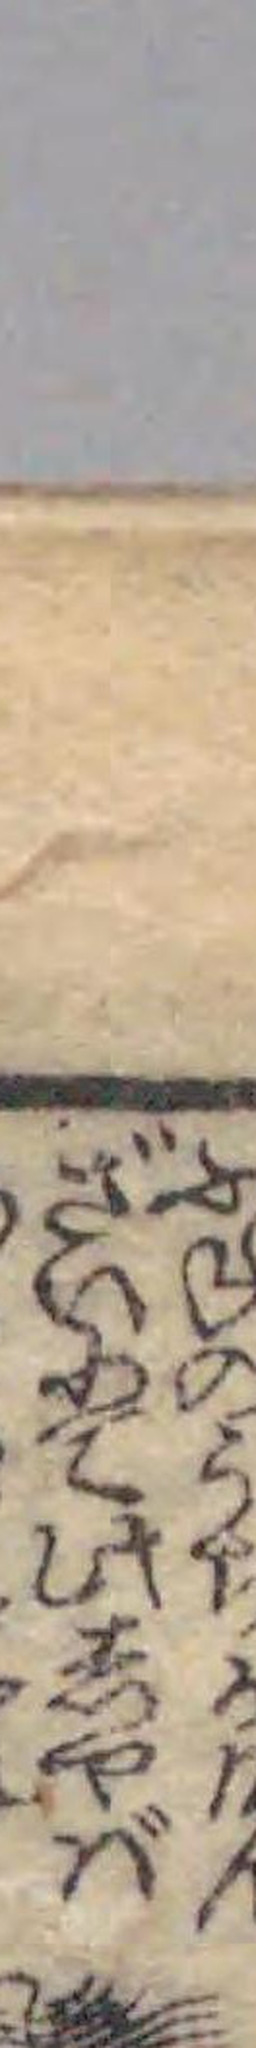ざいにて此しやば
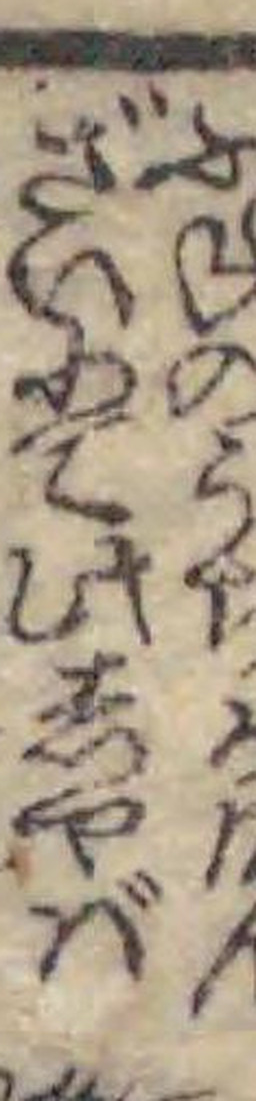ざいにて此しやば
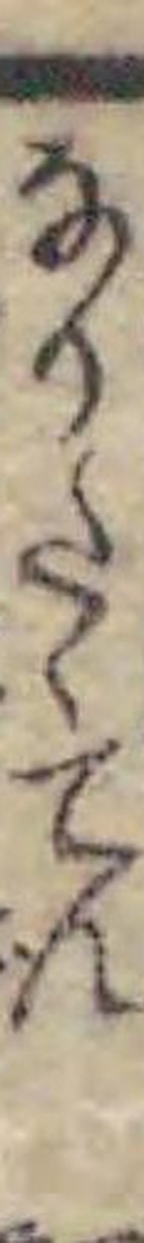なりたゝてん
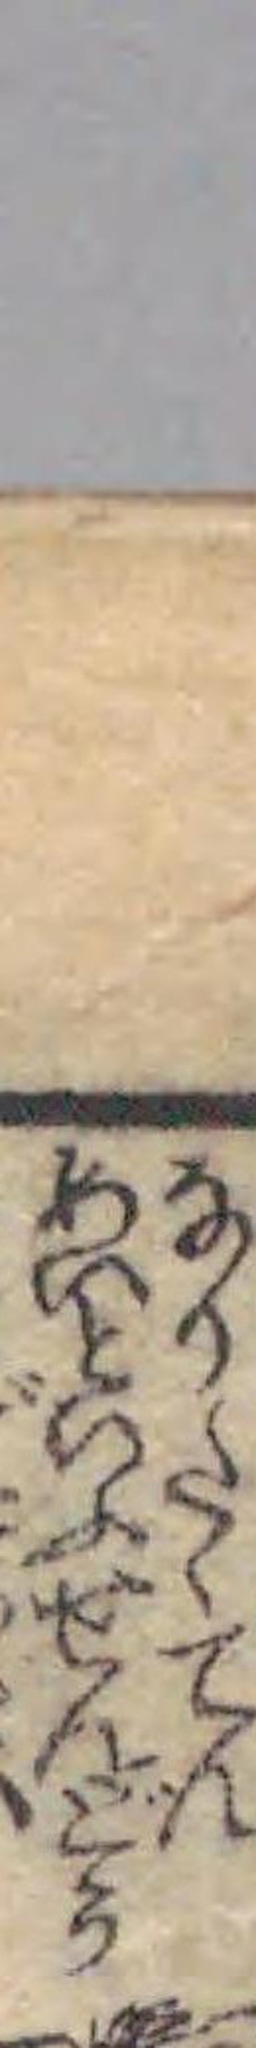めいといふせんどう
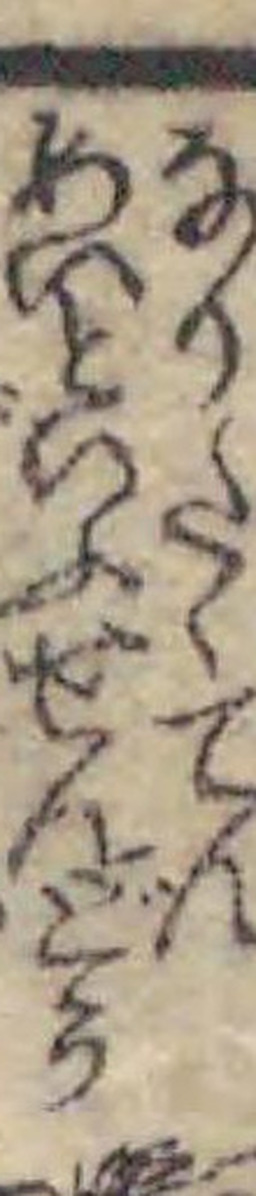めいといふせんどう
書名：人心鏡写絵 : 3巻
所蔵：国立国会図書館 National Diet Library, JAPAN
